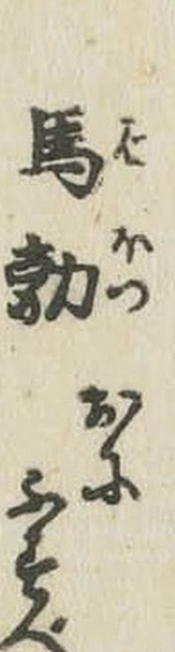馬勃おにふすべ
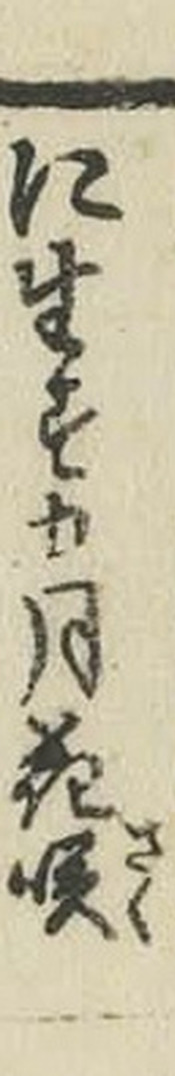に生す五月花咲
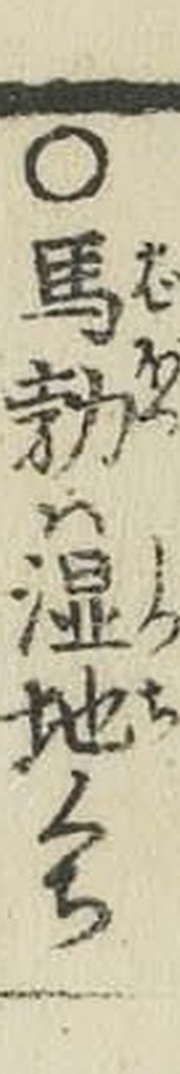○馬勃は湿地くち
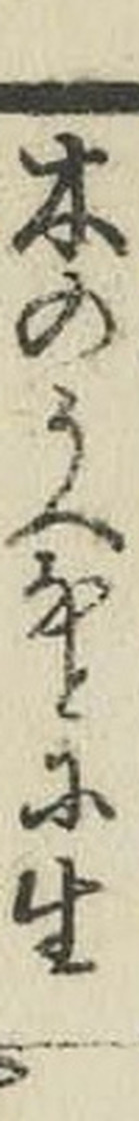木のうへなとに生
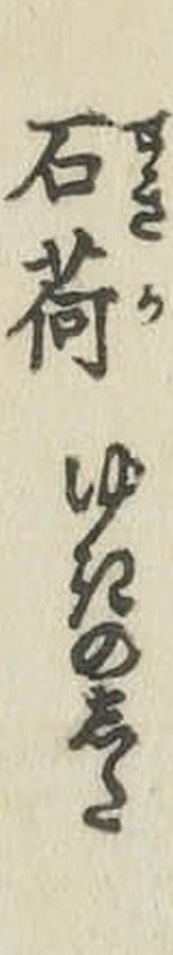石荷ゆきのした
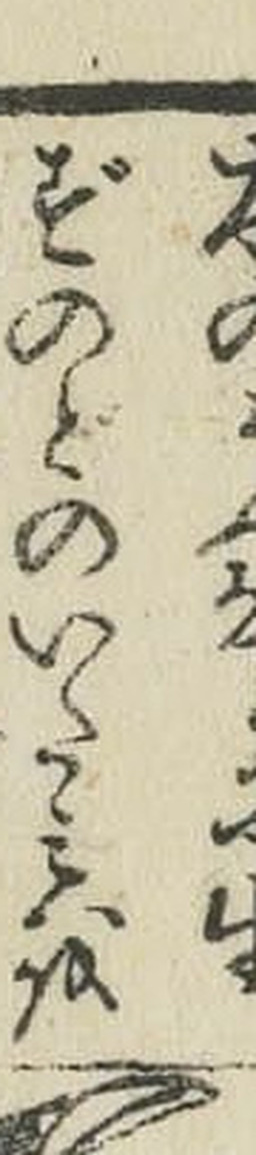ずのどのいたみを
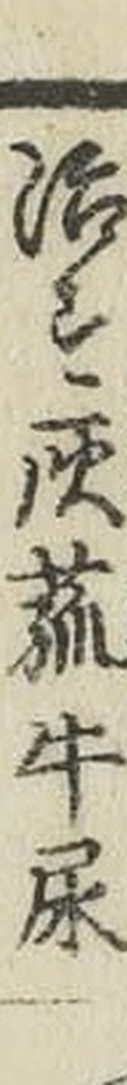治す灰菰牛尿
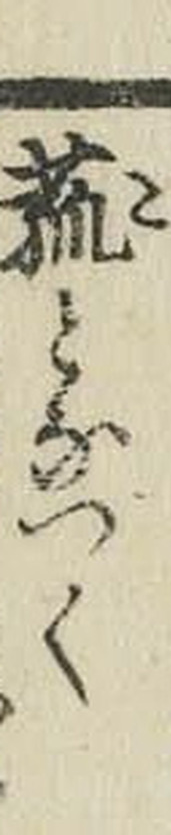菰となつく
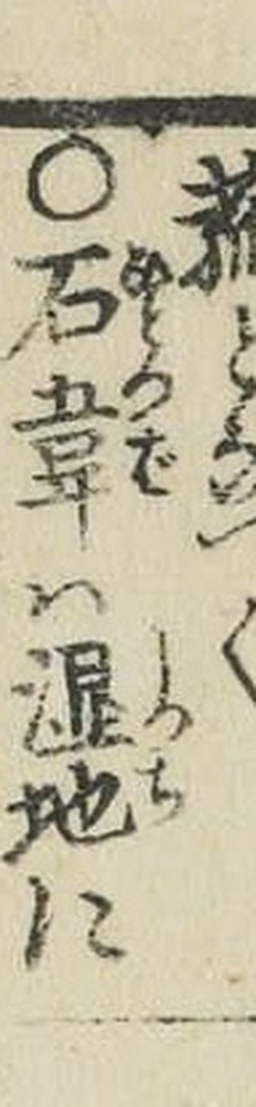○石韋は湿地に
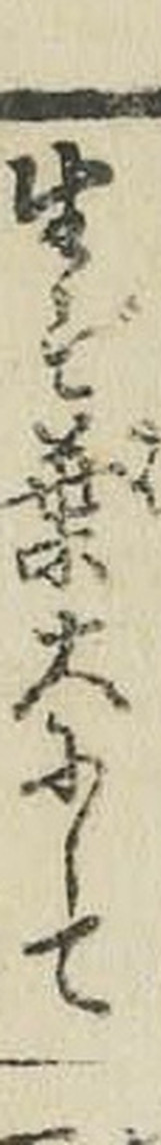生ず葉大にして
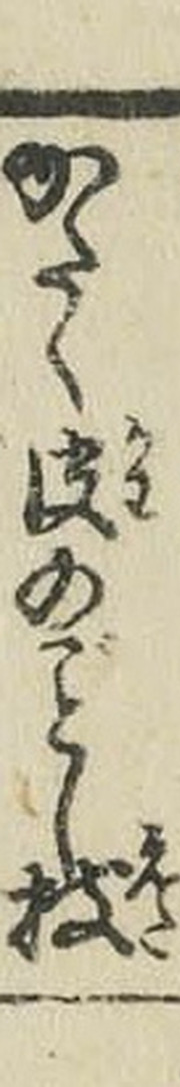かたく皮のごとし枝
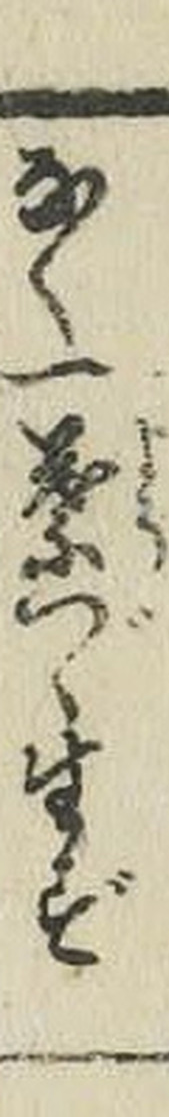なく一葉づゝ生ず
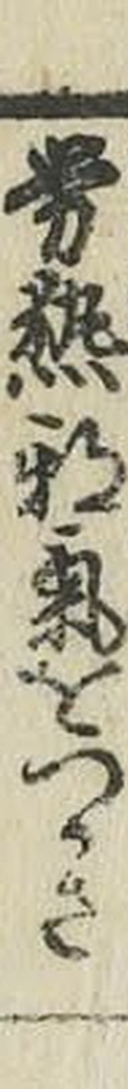労熱邪気をつかさ
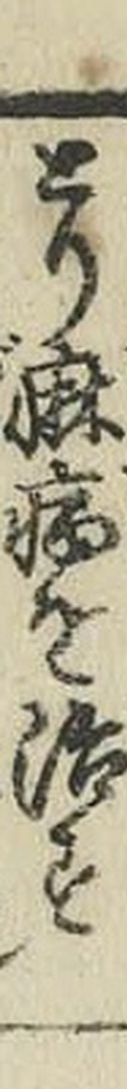とり痳病を治す
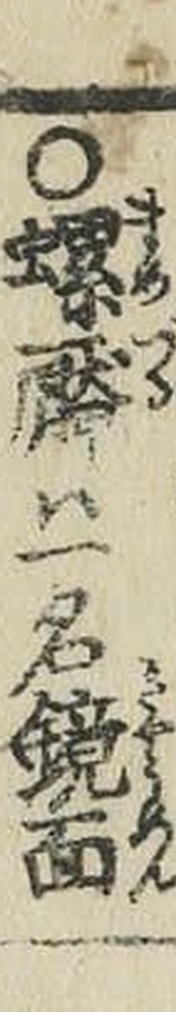○螺厴は一名鏡面
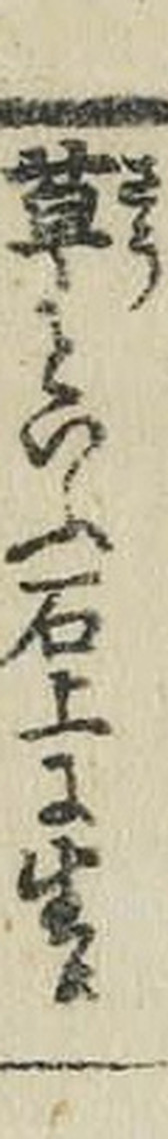草といふ石上に生す
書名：増補頭書訓蒙図彙大成 10巻 9:巻之20
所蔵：東京学芸大学教育コンテンツアーカイブ
